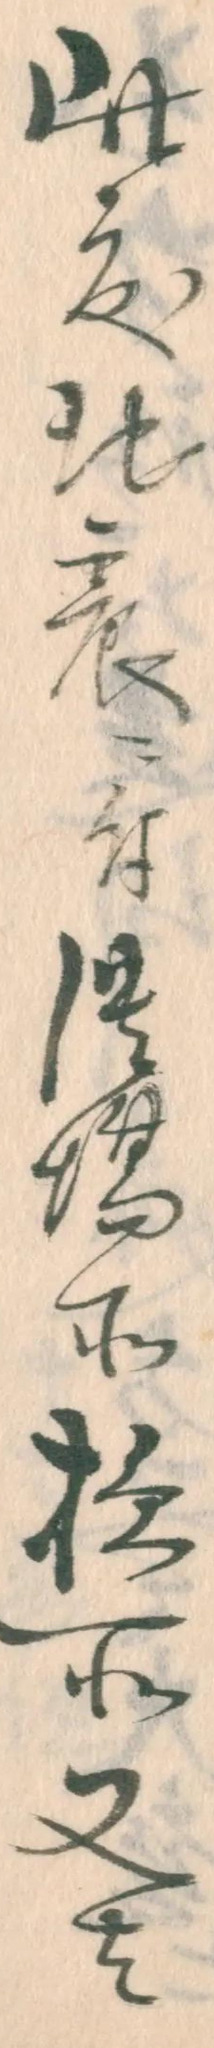此度地震ニ付潰場所損所又は

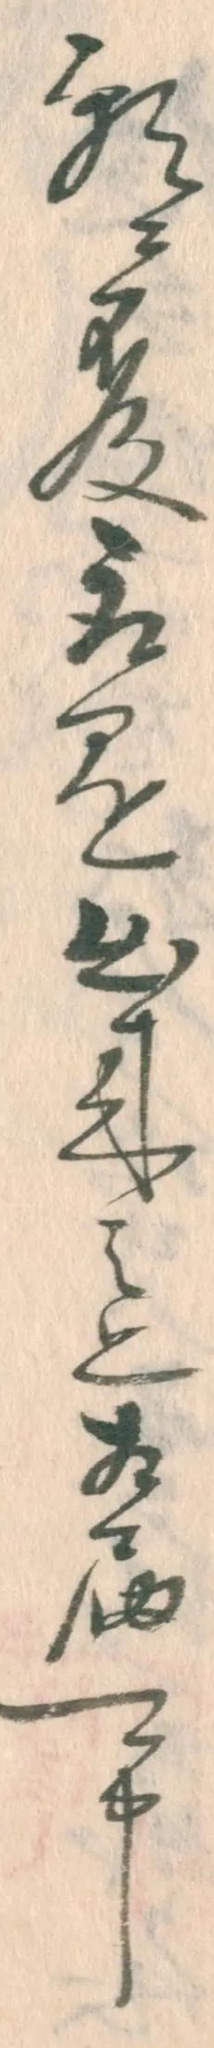願ニ不及取懸出来之上相届可申
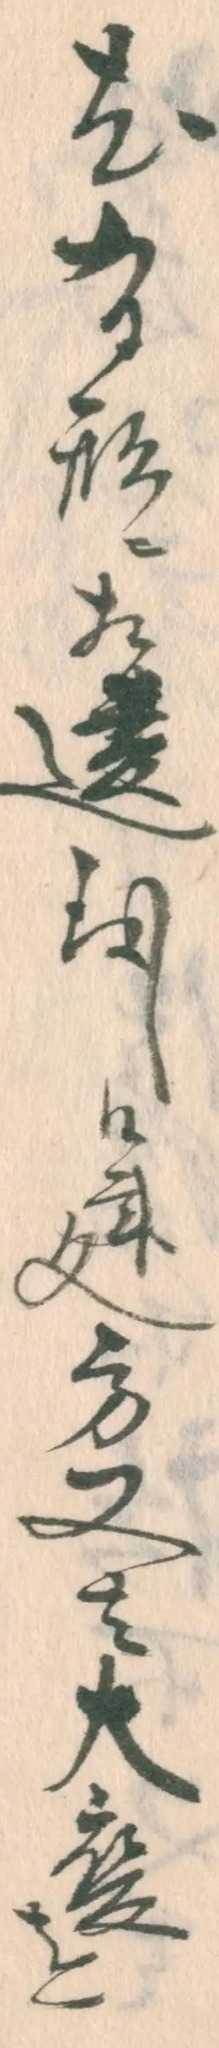尤有形ニ相違致し候建方又は大変を
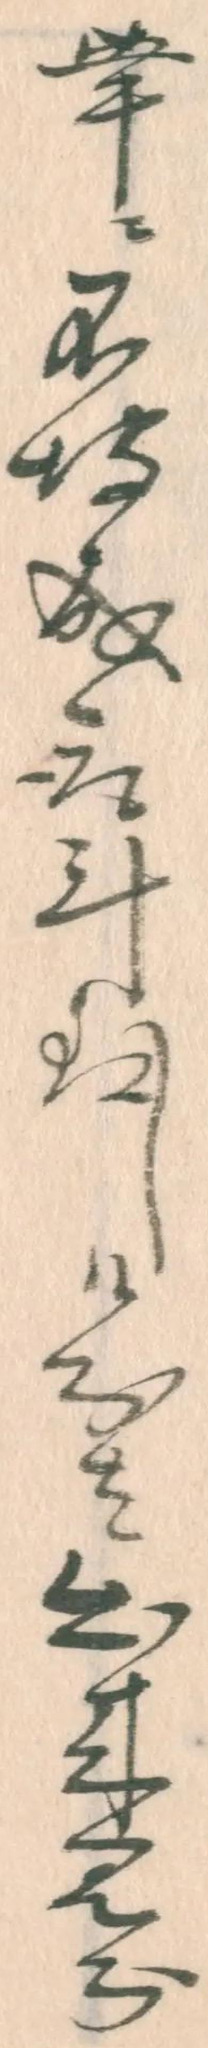幸ニ不埒成取計致し候分は出来見分
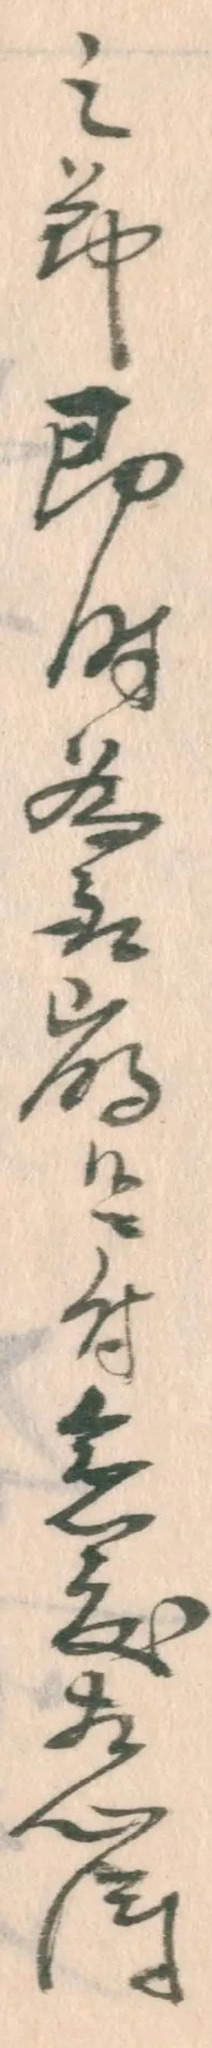之節即時為取崩候ニ付急度相心得
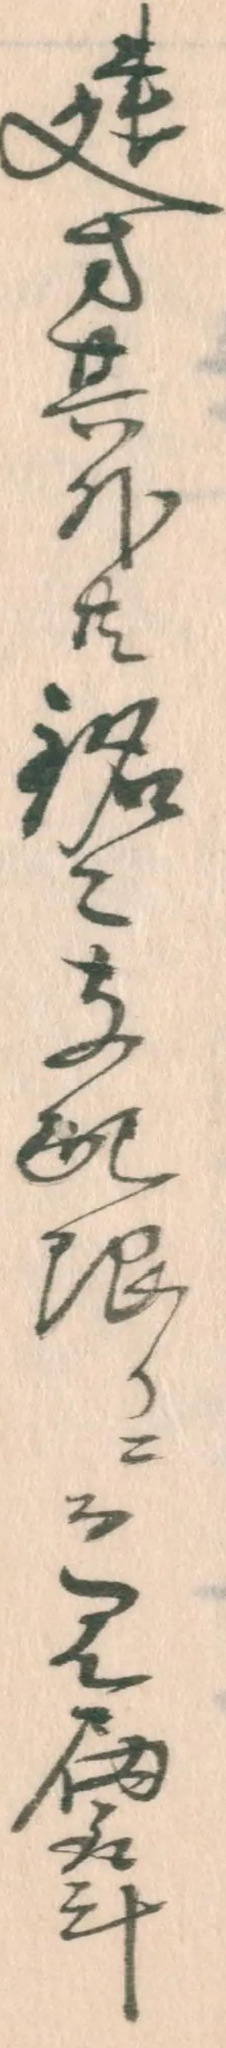建方其外共銘々支配限リニ而見届取計
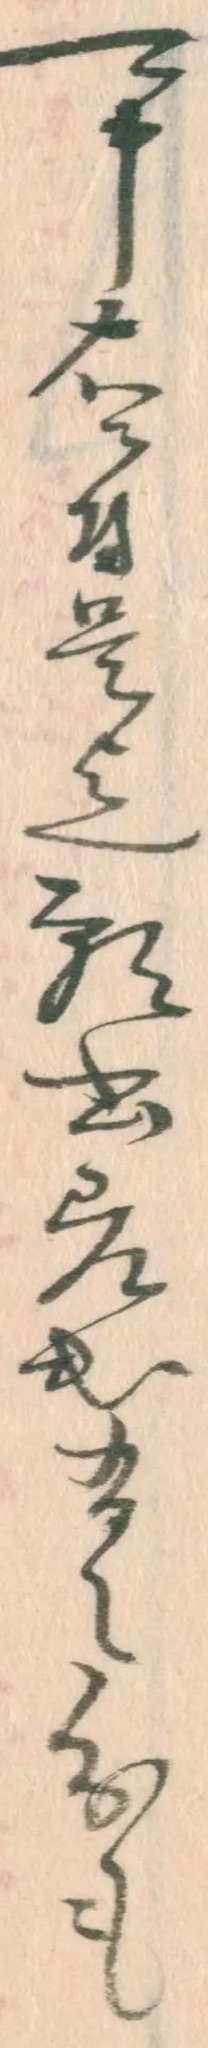可申右ニ付是迄願書差出有之候分も
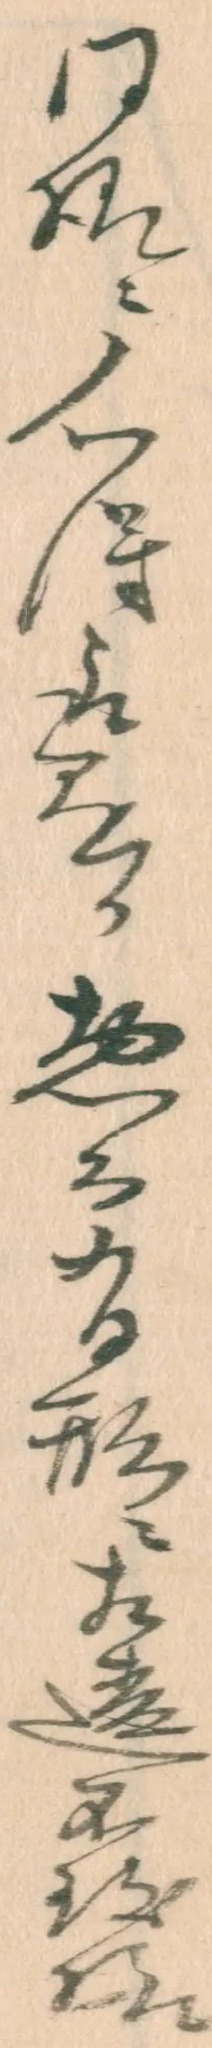同様ニ心得取懸リ惣而有形ニ相違不致様
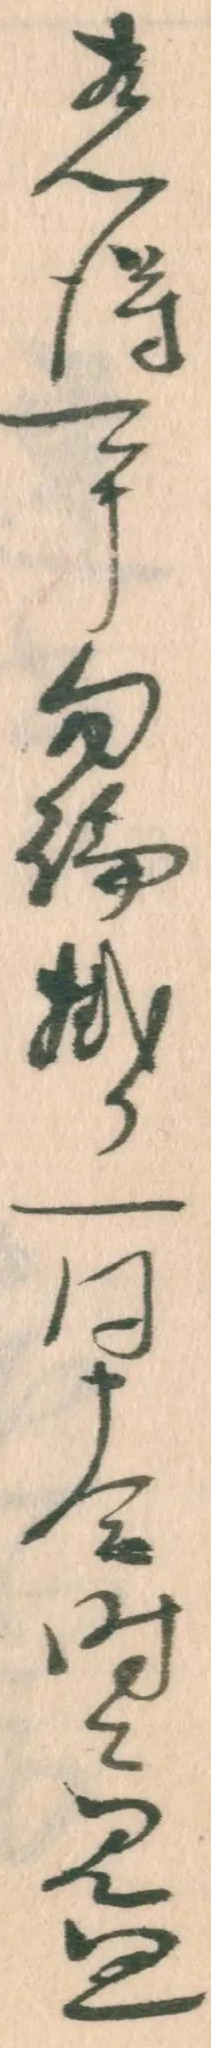相心得可申勿論掛リ一同申合時々見廻
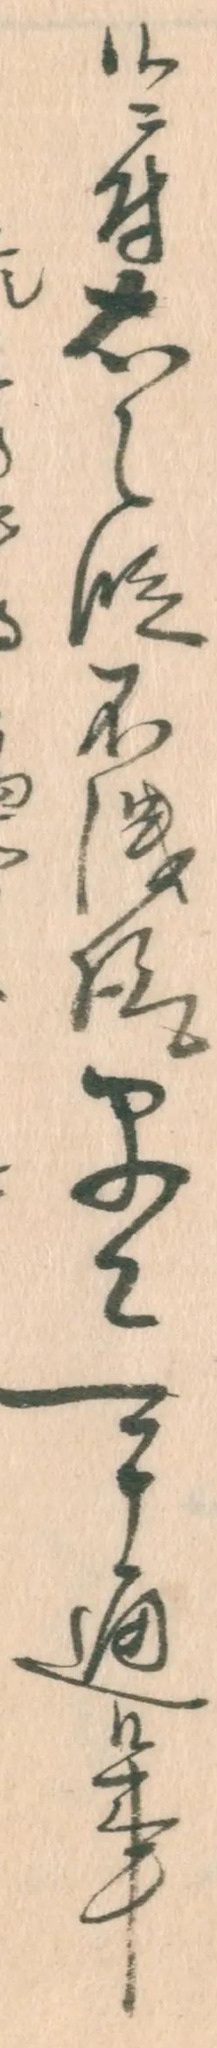候ニ付右之段不洩様早々可申通候事
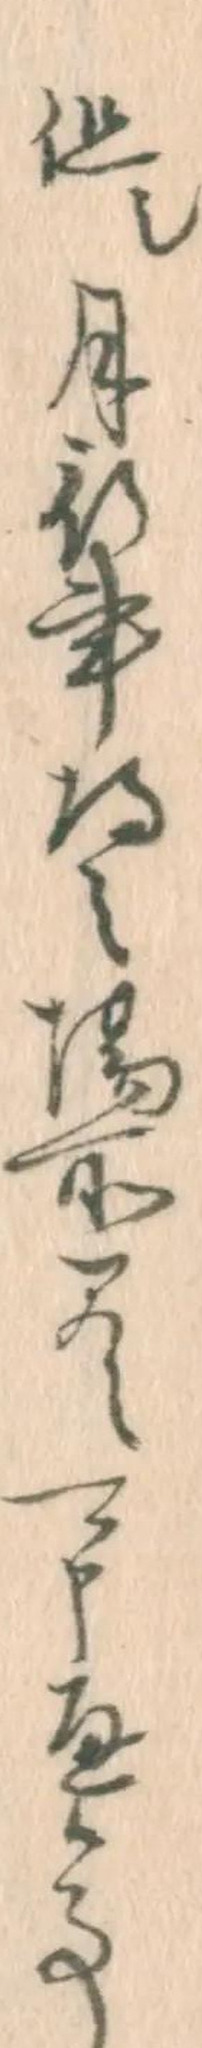但シ月行事持之場所早〻可申通候事
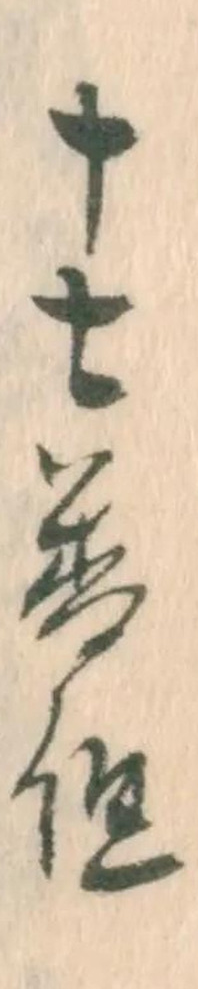十七番組
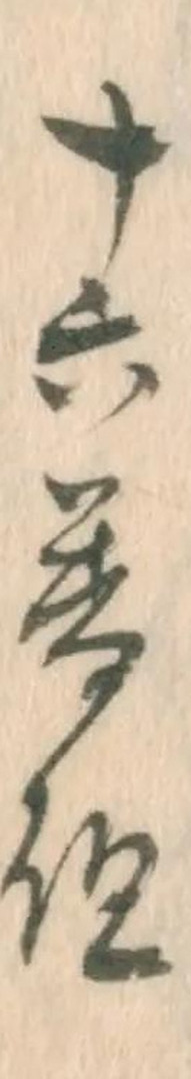十六番組
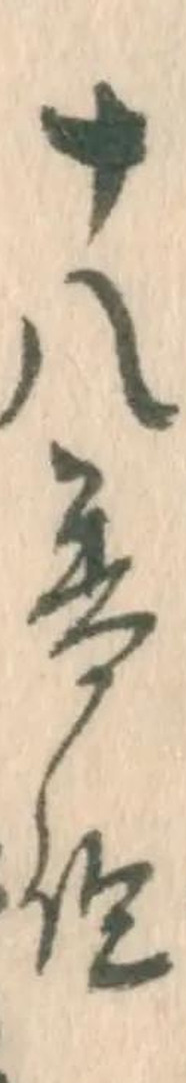十八番組
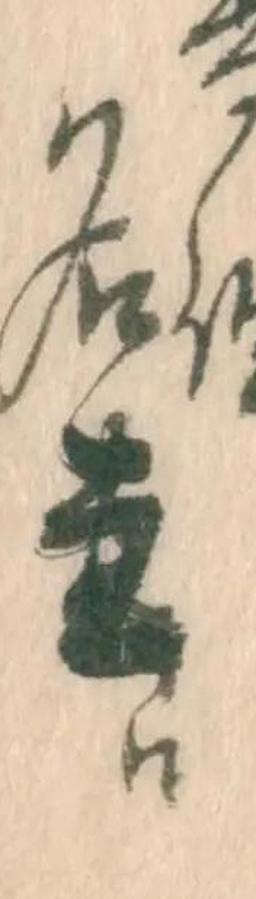名主え

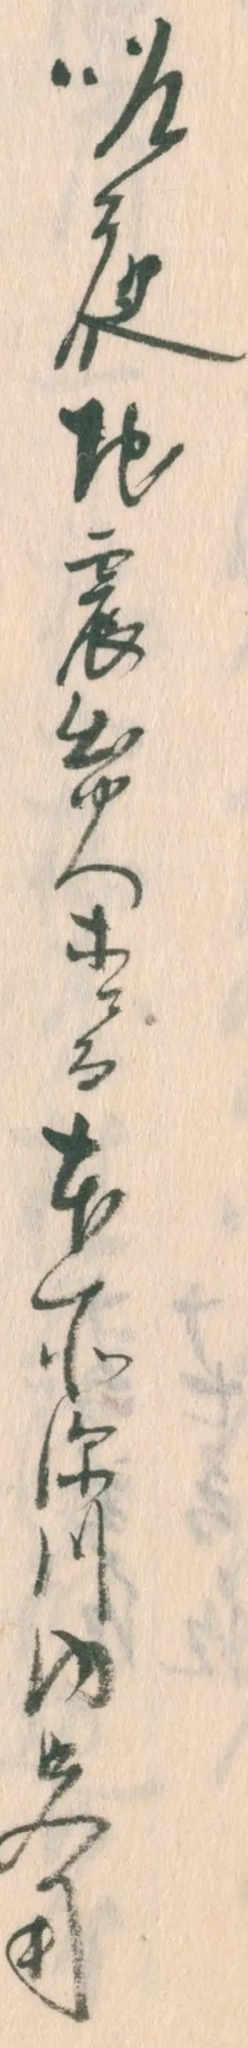昨夜地震出火等ニ而本所深川内御入用
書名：地震災書留 2巻. [1] 内表紙に「地震災書留　安政二卯年　但本所深川御用屋敷地代免除調」とあり
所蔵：国立国会図書館 National Diet Library, JAPAN
